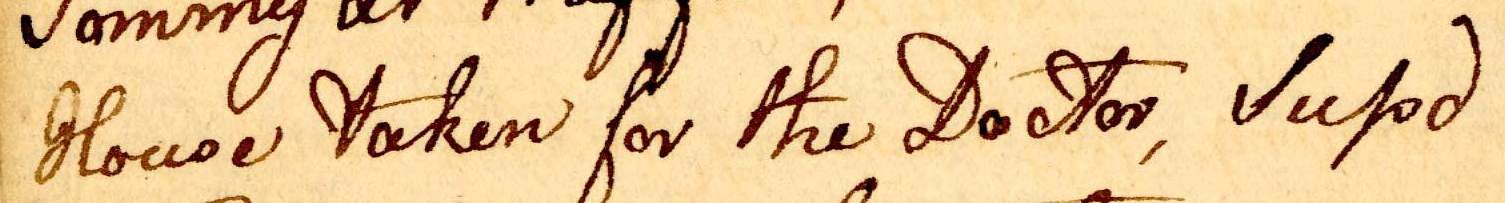House taken for the Doctor, Supd
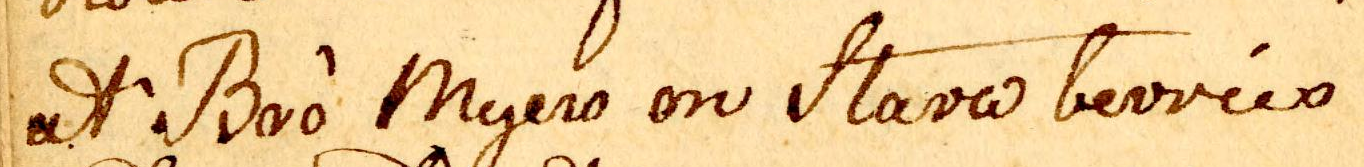at Bro' Myers on Starwberries
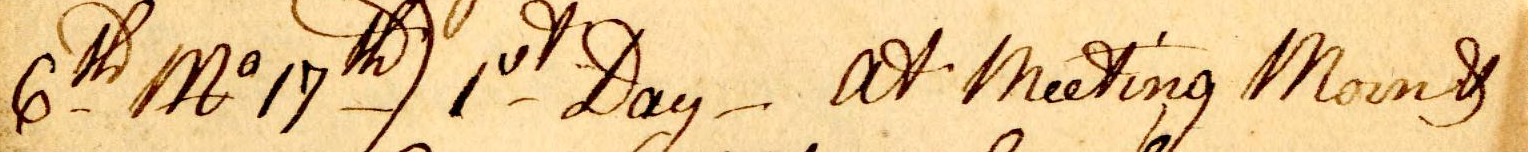6^th M^o 17^th) 1^st Day- At Meeting Morn &
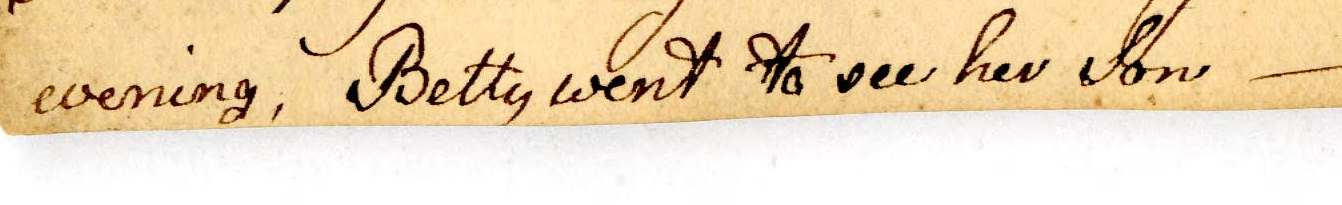evening, Betty went to see her Son
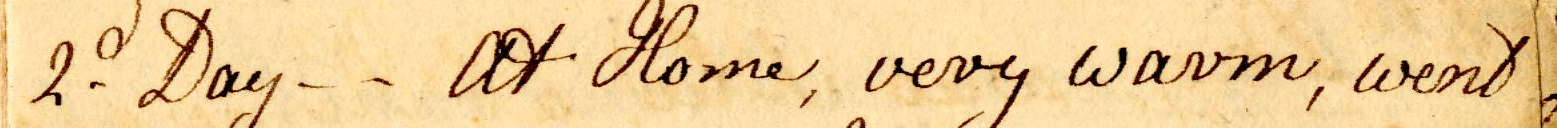2^d Day- At Home, very warm, went
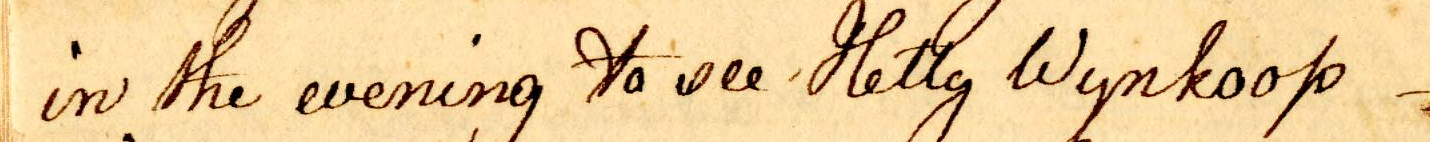in the evening to see Hetty Wynkoop
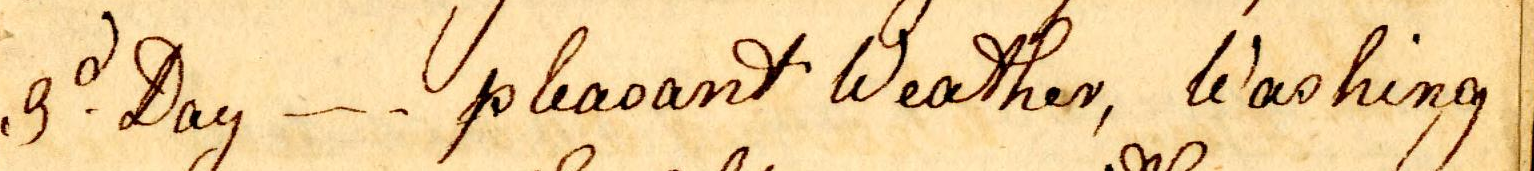3^d. Day- pleasant Weather, Washing
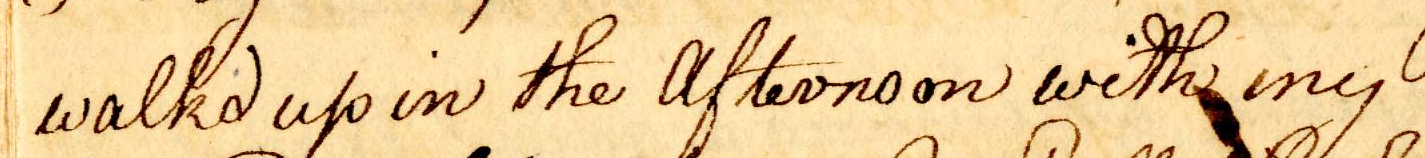walkd up in the Afternoon with my
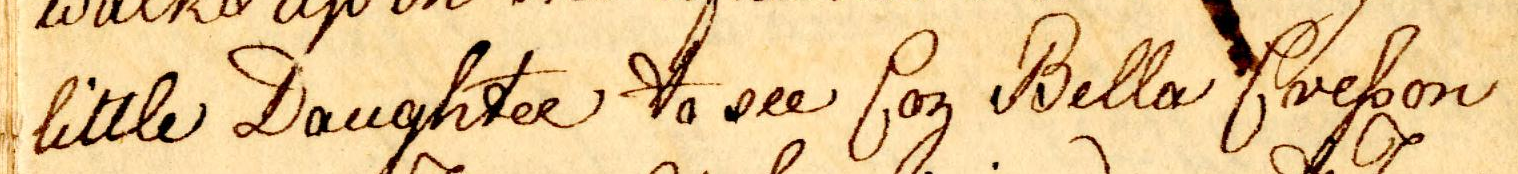little Daughter to see Coz Bella Cresson
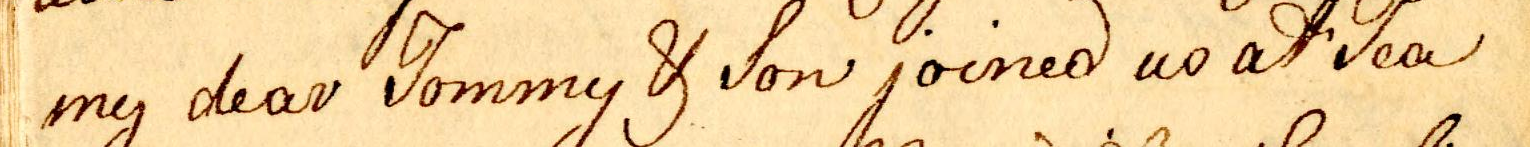my dear Tommy & Son joined us at Tea
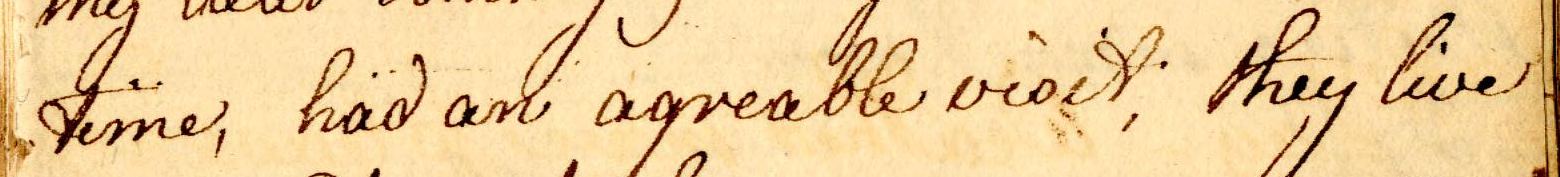time, had an agreable visit, they live
